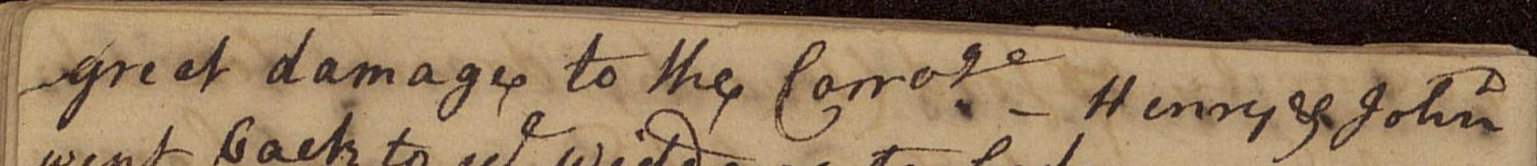great damage to the Carrage- Henry & John^D
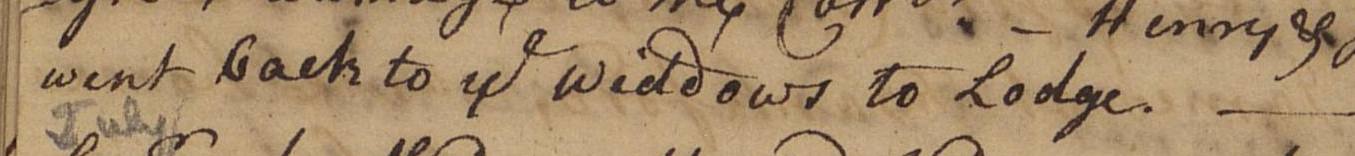went back to y^e Widdows to Lodge.-
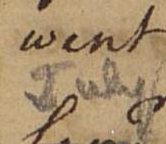July
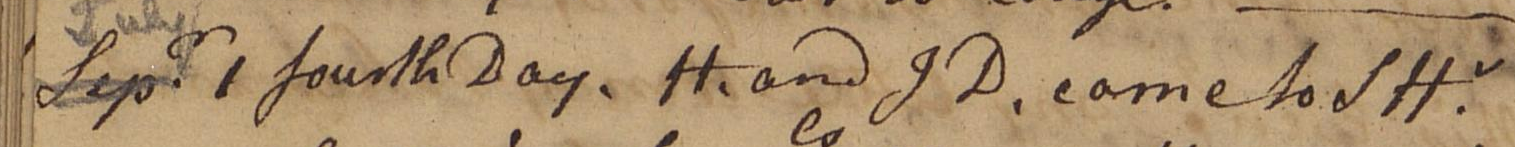Sep^m. 1 fourth Day. H. and JD, came to SH^s.
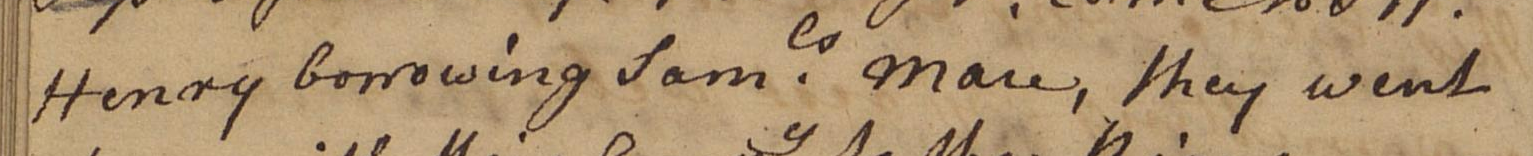Henry borrowing Sam^l. Mare, they went
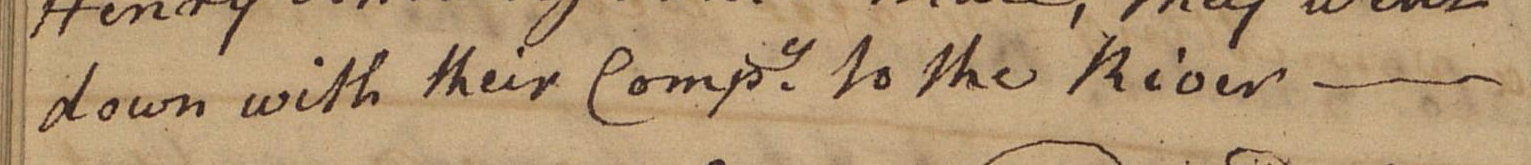down with their Comp^y. to the River-
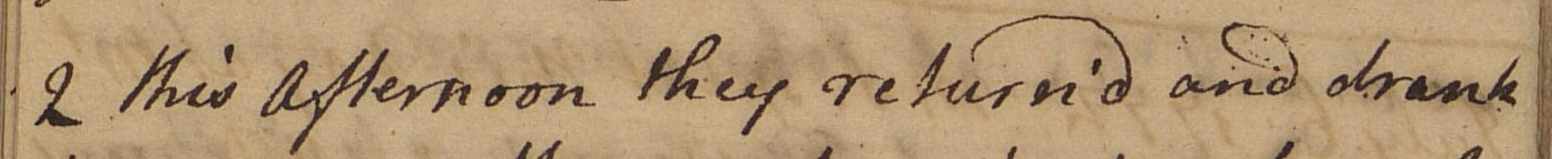2 this Afternoon they return'd and drank
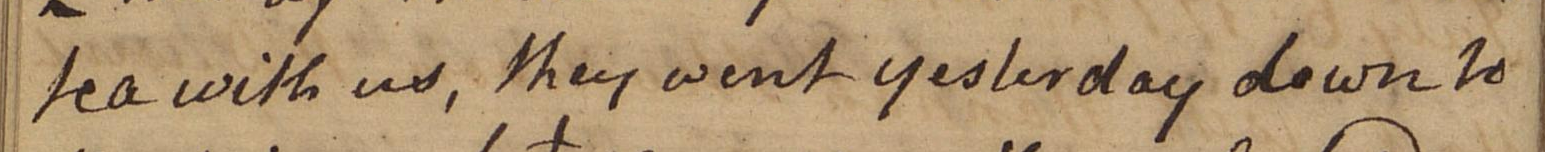tea with us, they went yesterday down to
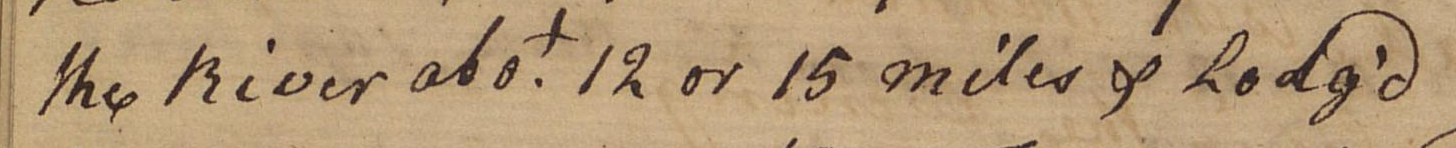thy River abo^t. 12 or 15 miles & Lodg'd
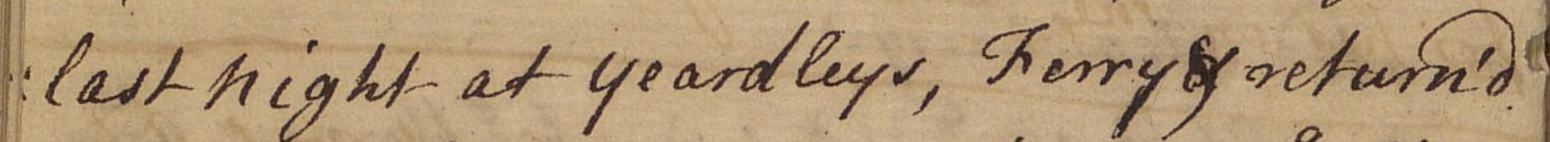last night at yeardleys, Ferry & return'd
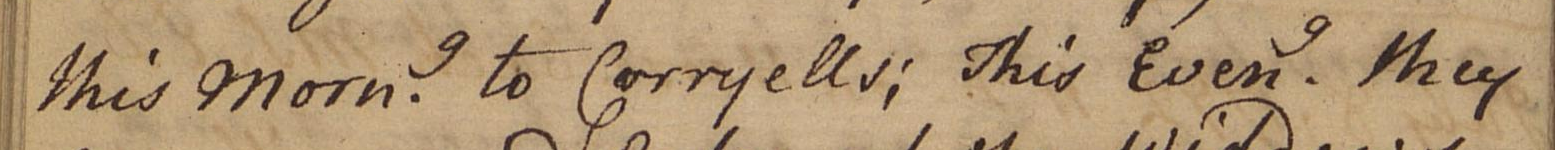this morn^g. to Corryells; This Even^g. they
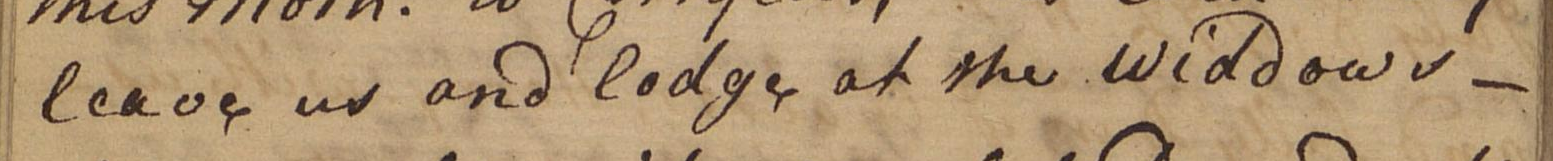leave us and lodge at the Widdows-
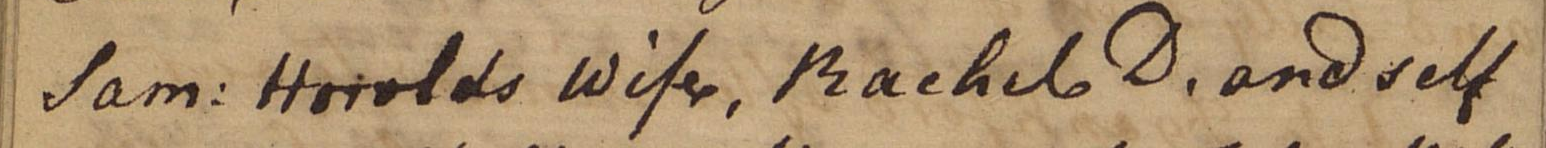Sam: Horolds Wife, Rachel D, and self
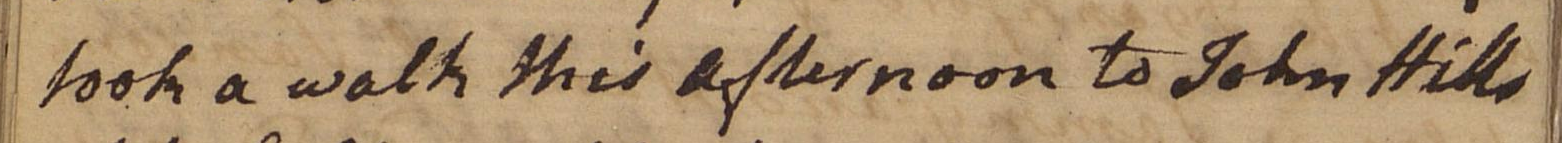took a walk this afternoon to John Hills
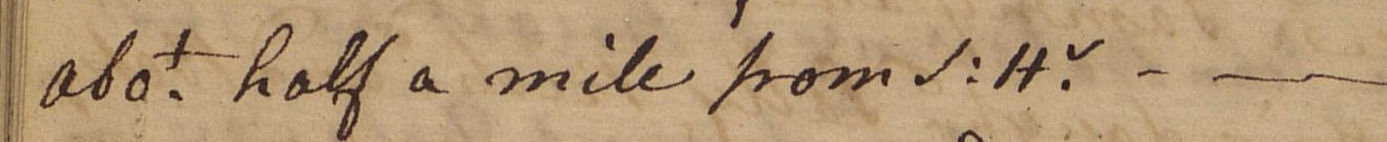abo^t. half a mile from S: H^s.-
